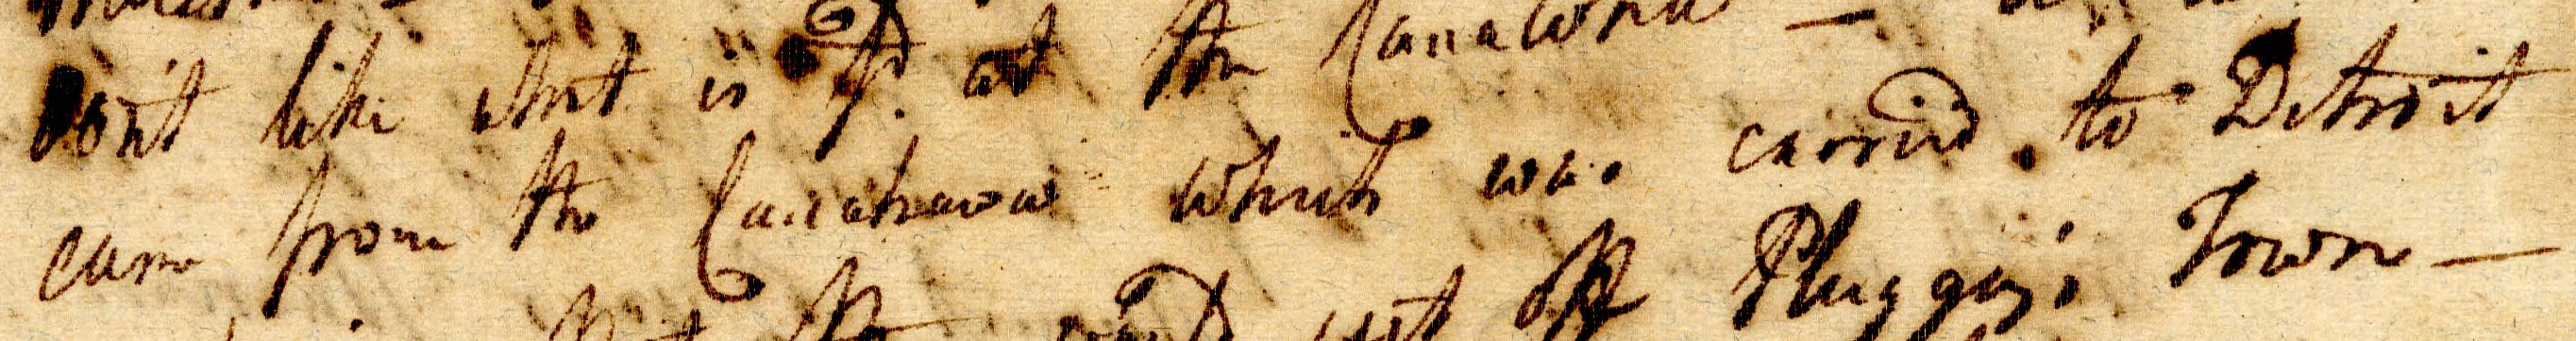came from the Canahawa which was carried to Detroit
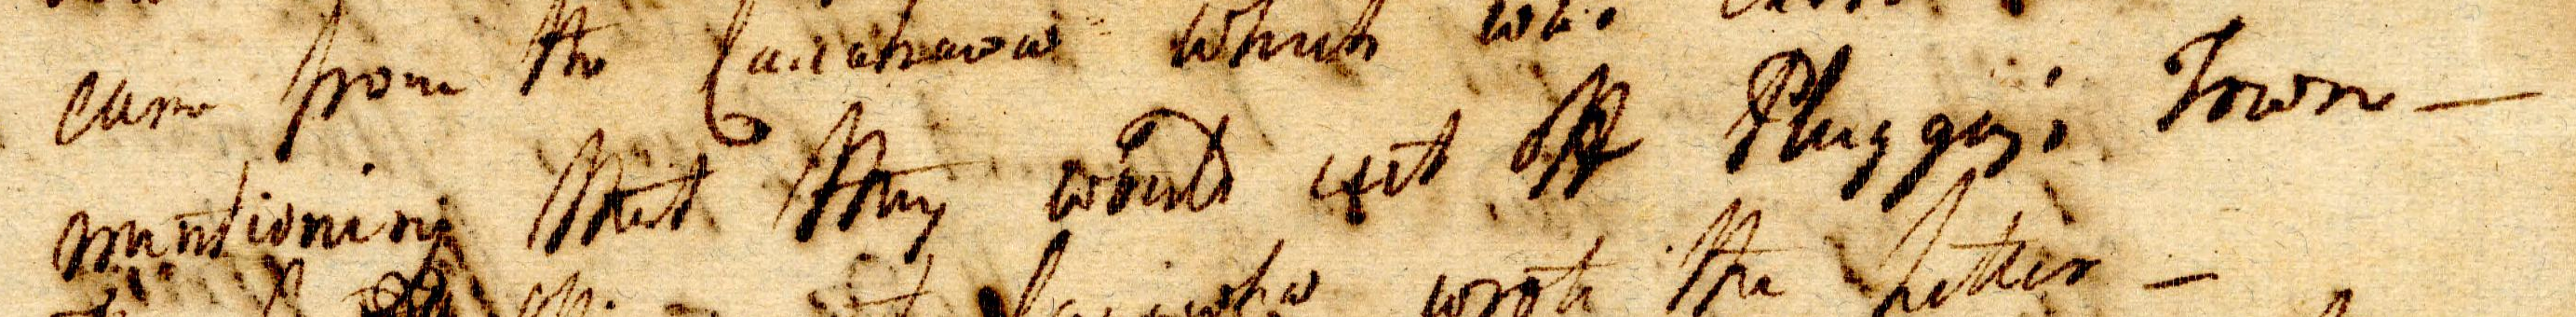mentioning that they would cut off Pluggeys Town-
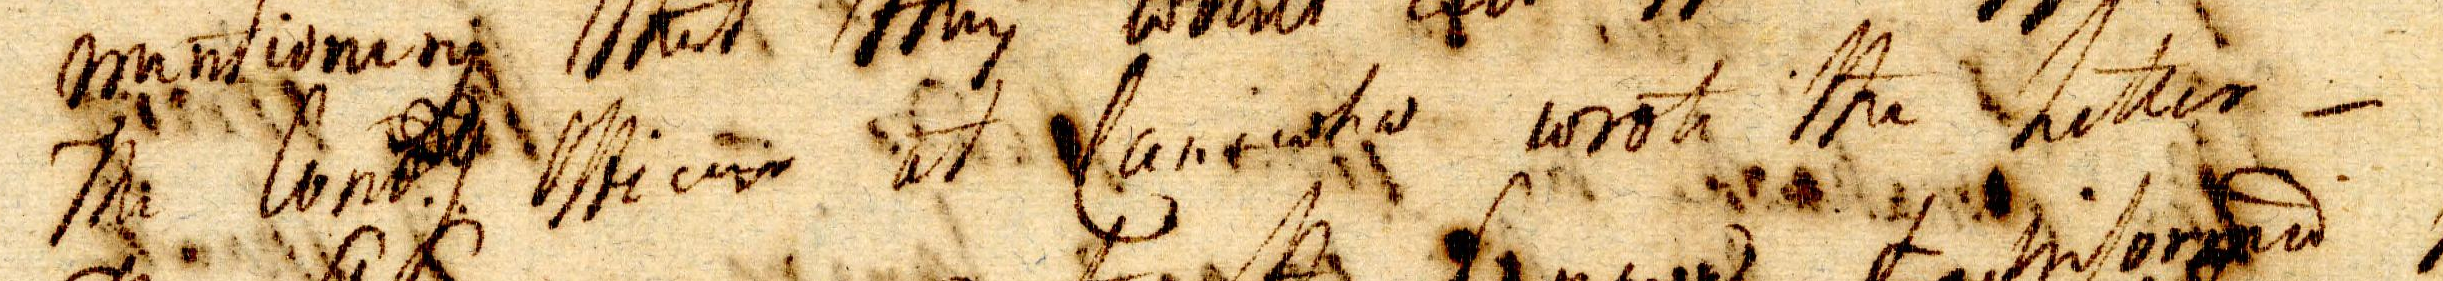The Comd^g. Officers at Canawha wrote the Letter-
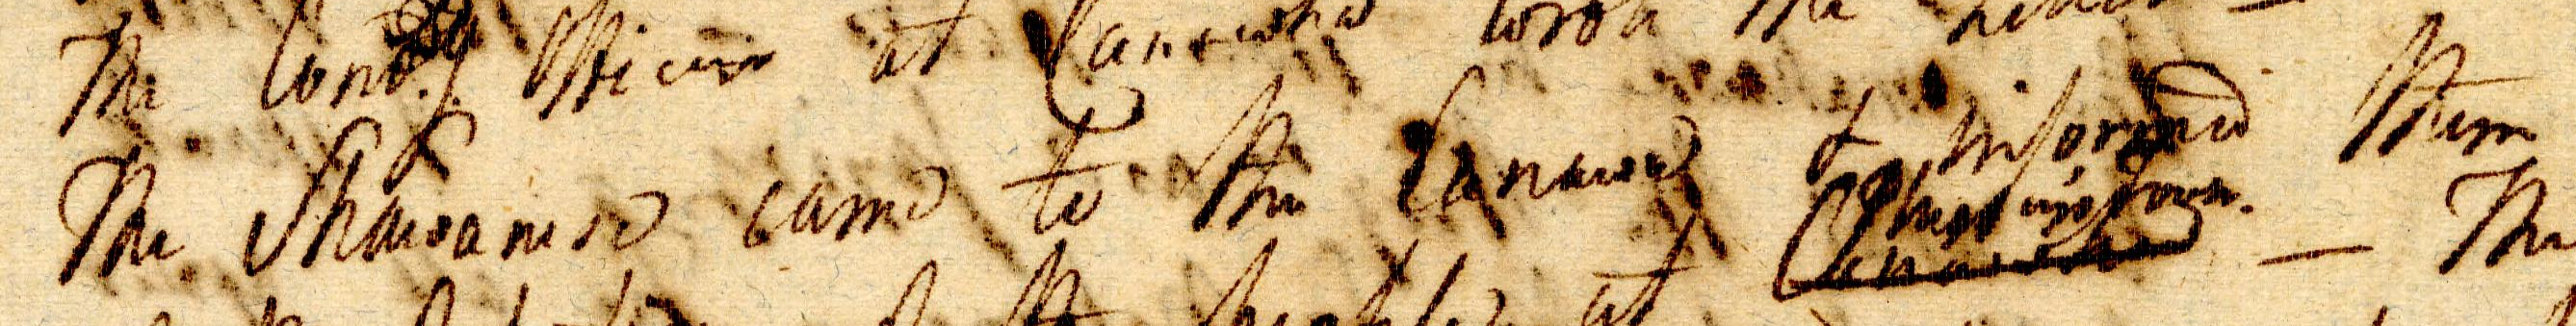The Shawanese came to the Canawa & informed them
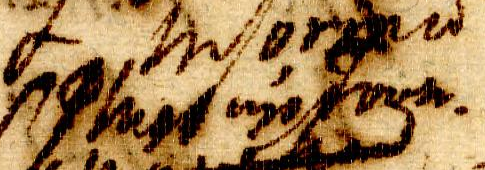Pluggey's Town.
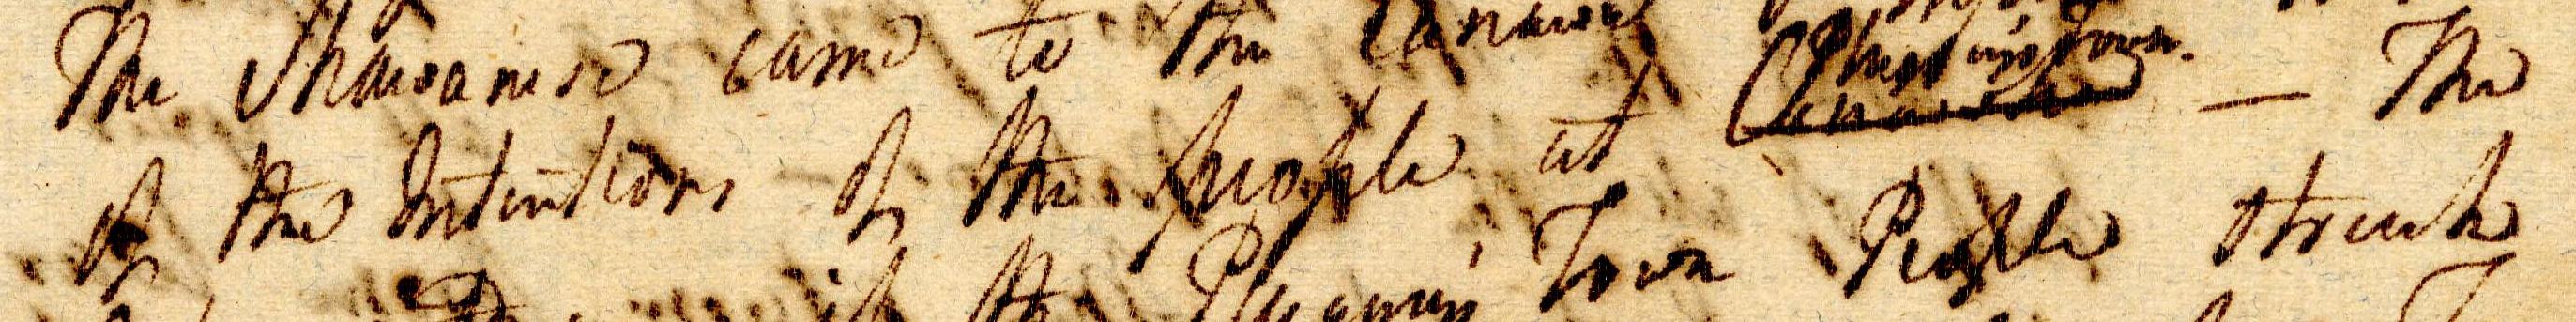of the Intentions of the people at Canawha.^- The
